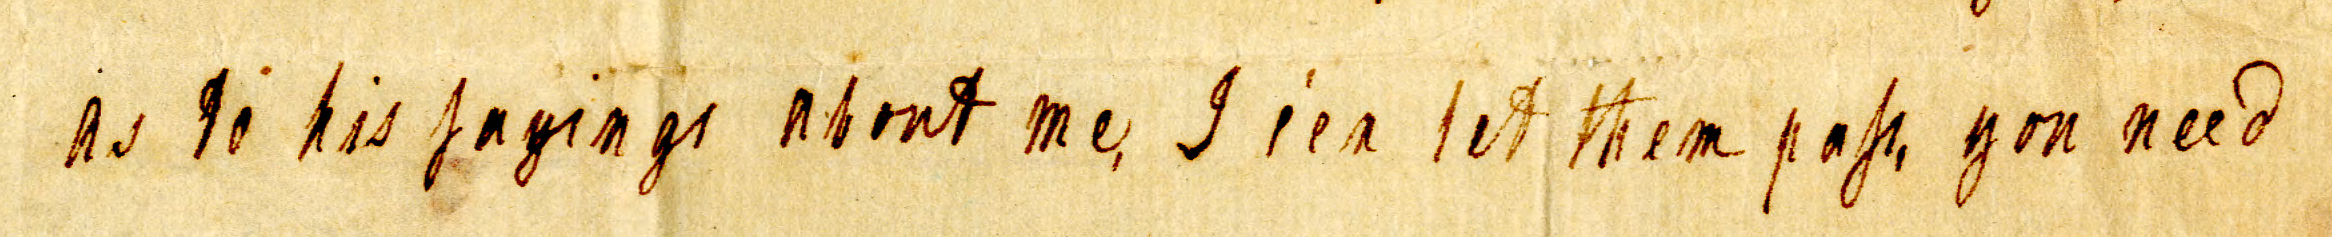as to his sayings about me, I r'en let them pass, you need
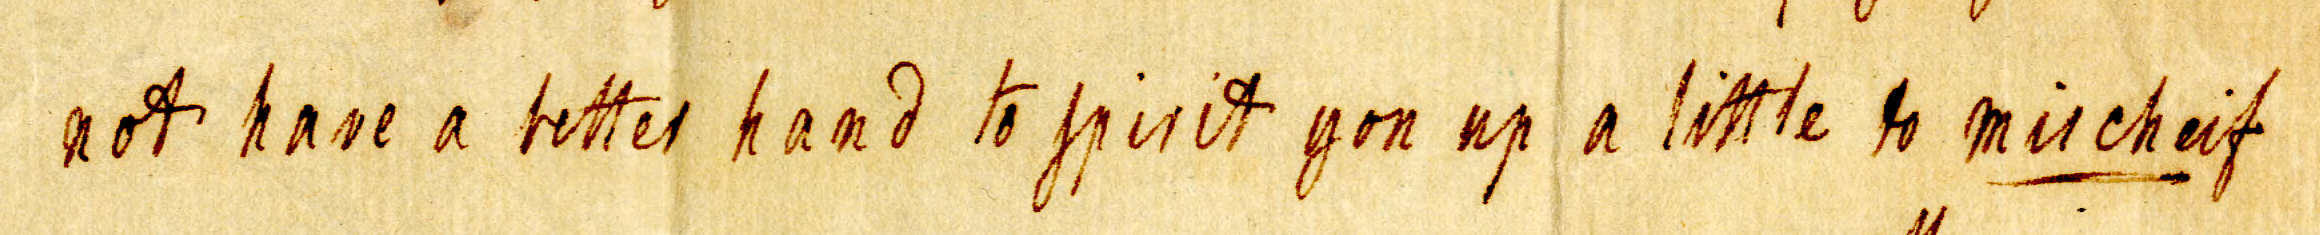not have a better hand to spirit you up a little to mischeif
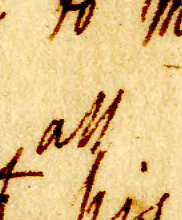all
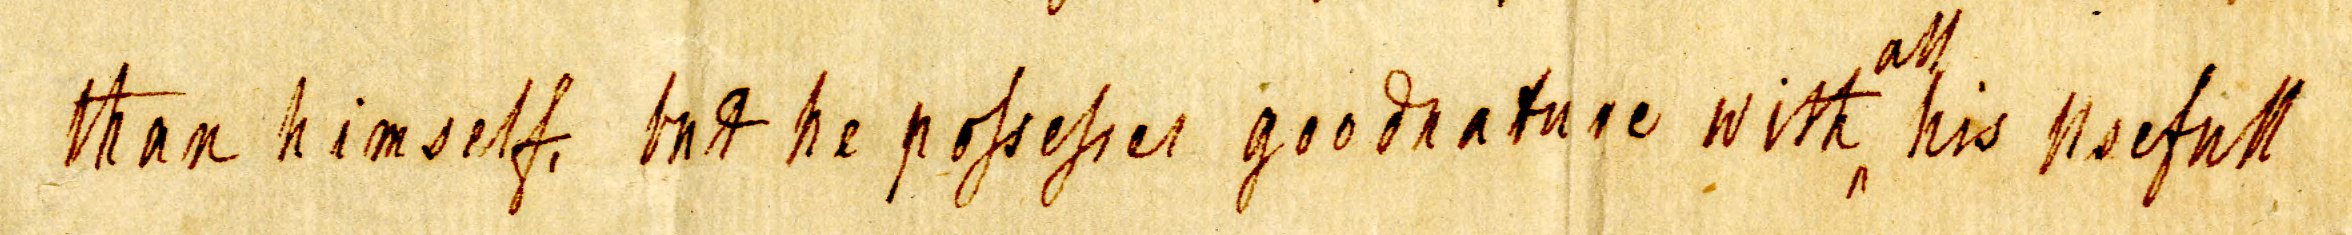than himself, but he possesses good nature with ^ his usefull
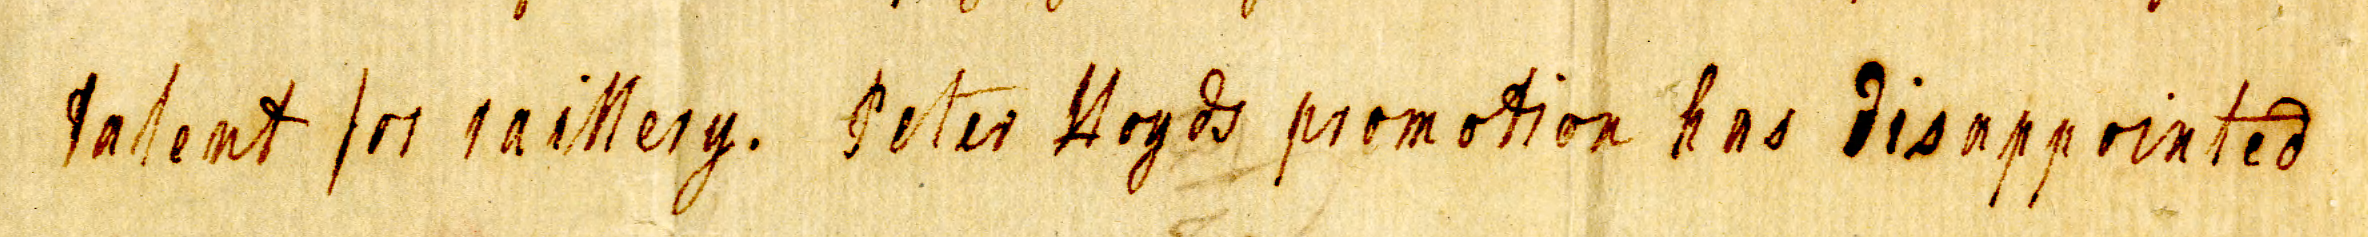talent for raillery. Peter Hoyds promotion has disappointed
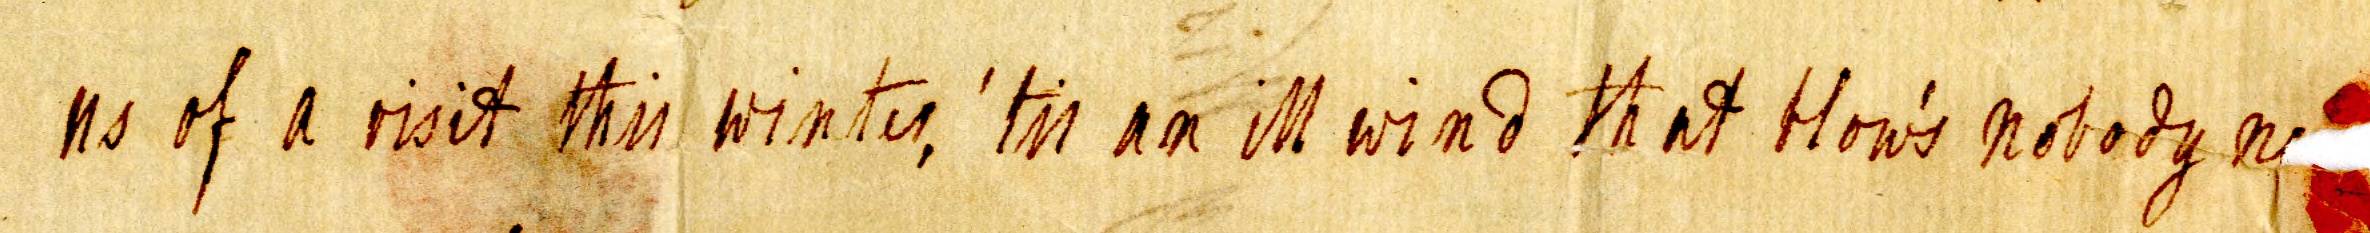us of a visit this winter, 'tis an ill wind that blow's nobody no
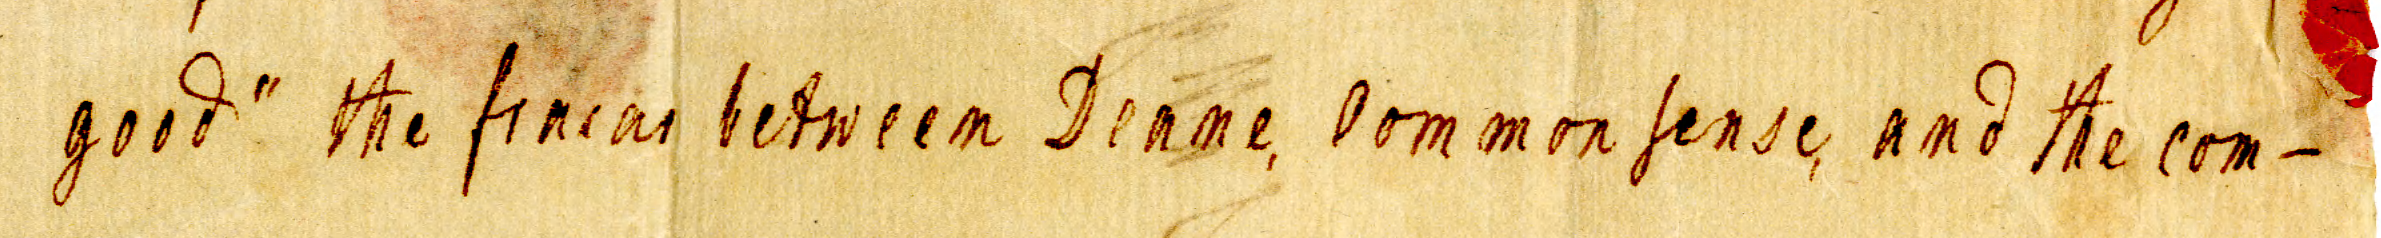good" the fracas between Deane, common sense, and the com-
